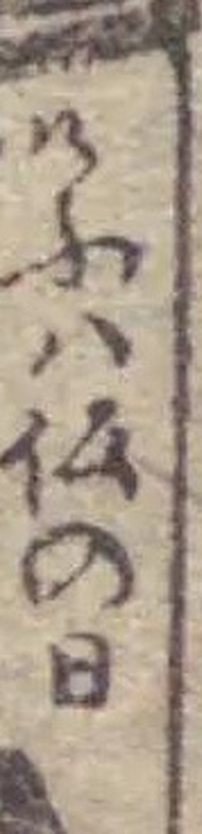けふは仏の日
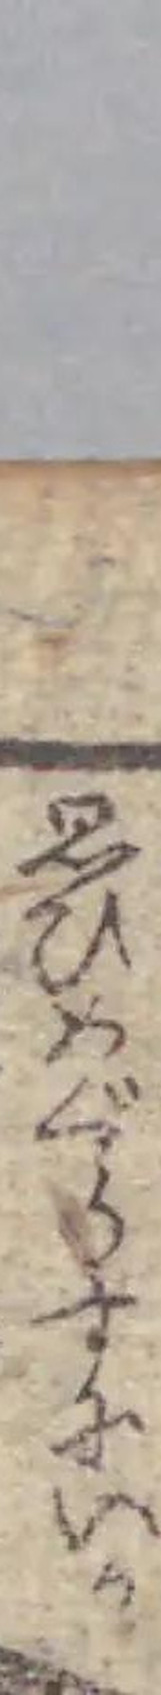思ひめぐらすにいか
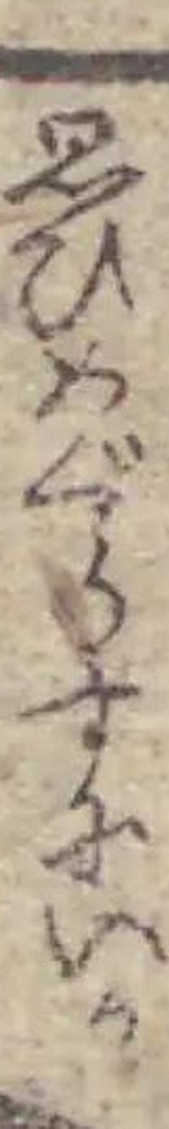思ひめぐらすにいか
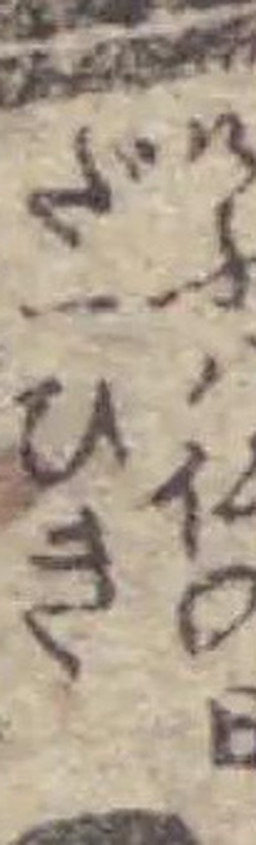だ一ひき
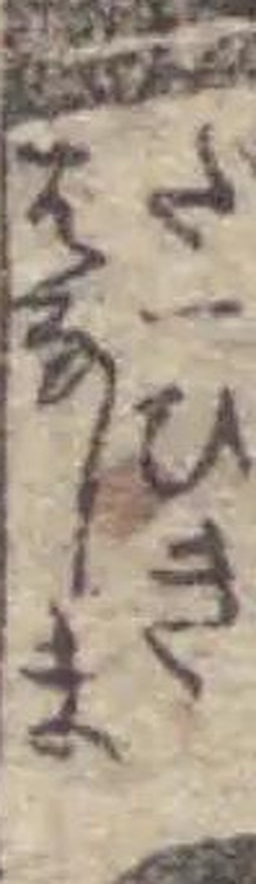はなしま
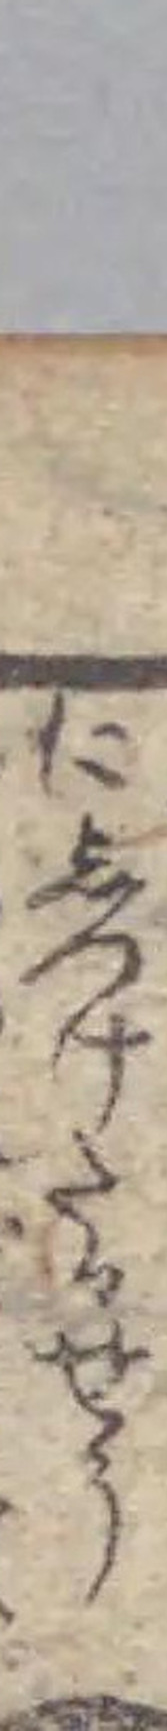にしつけたるせう
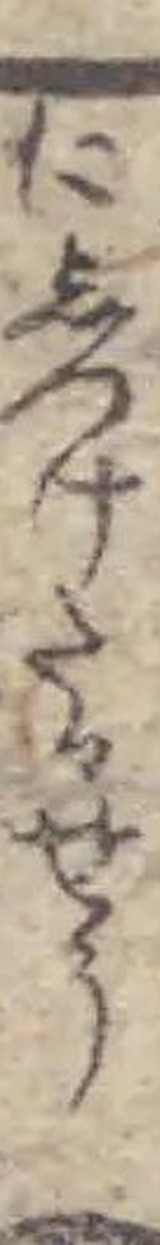にしつけたるせう
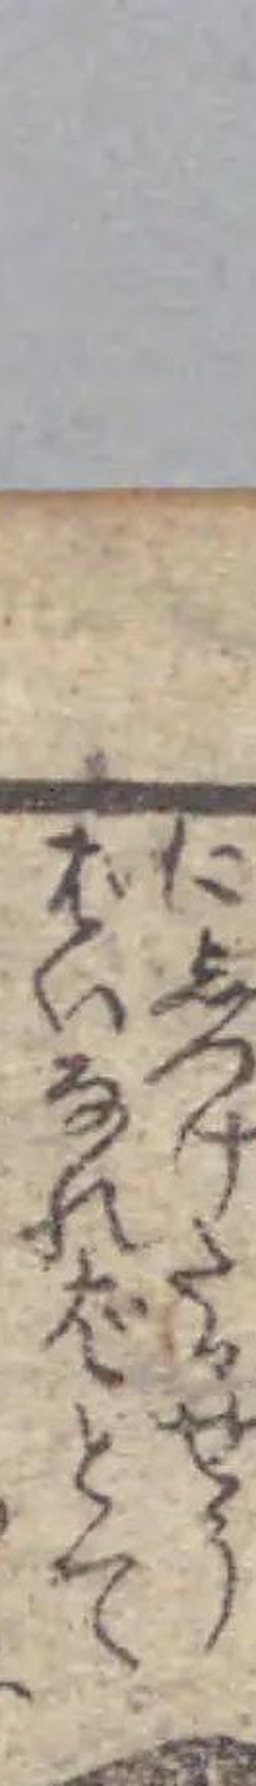ばいなればとて
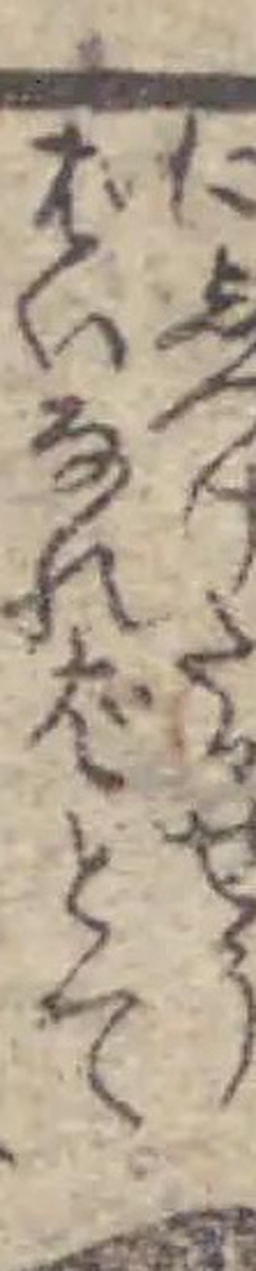ばいなればとて
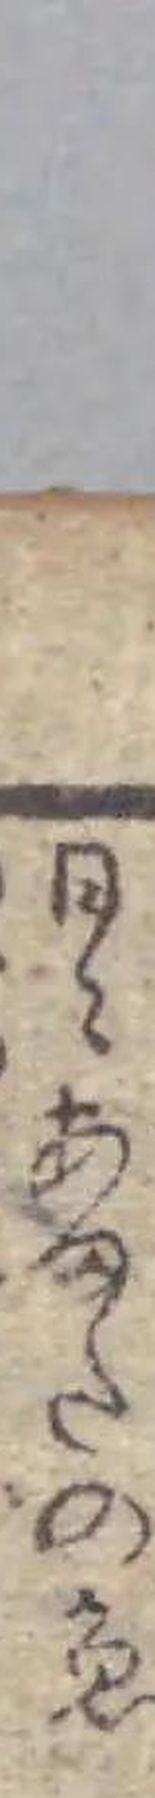日々あまたの魚
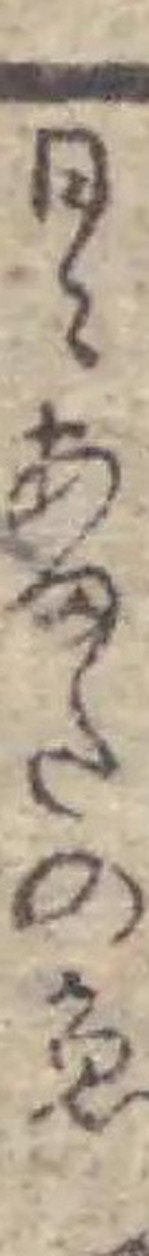日々あまたの魚
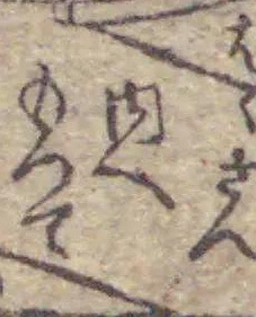もつて
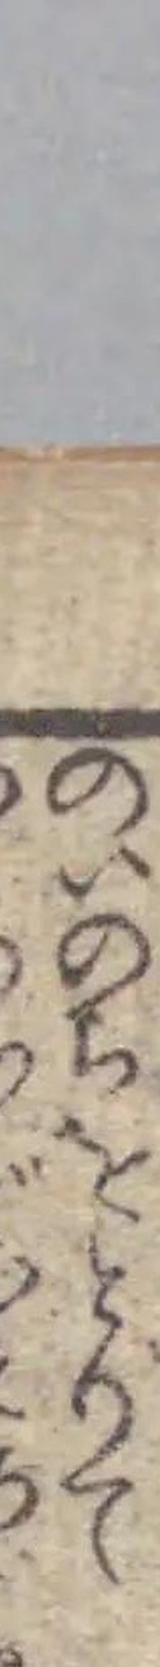のいのちをとりて
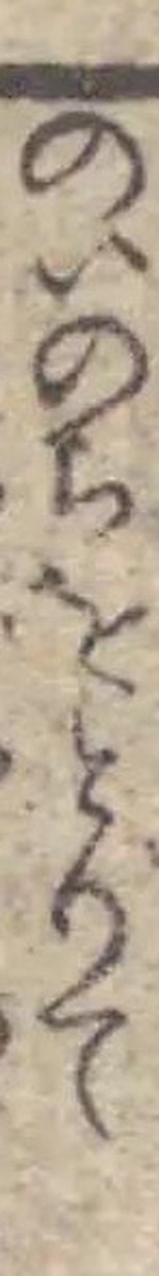のいのちをとりて
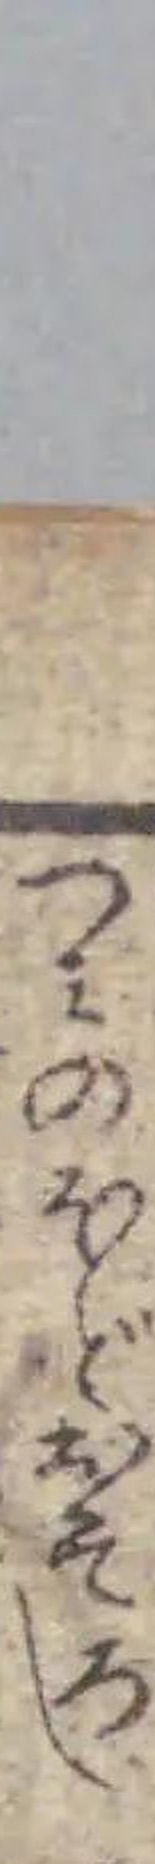つみのほどおそろし
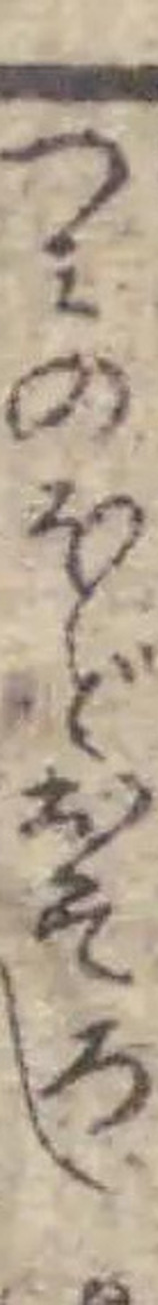つみのほどおそろし
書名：見立蓬莱 : 2巻
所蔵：国立国会図書館 National Diet Library, JAPAN
